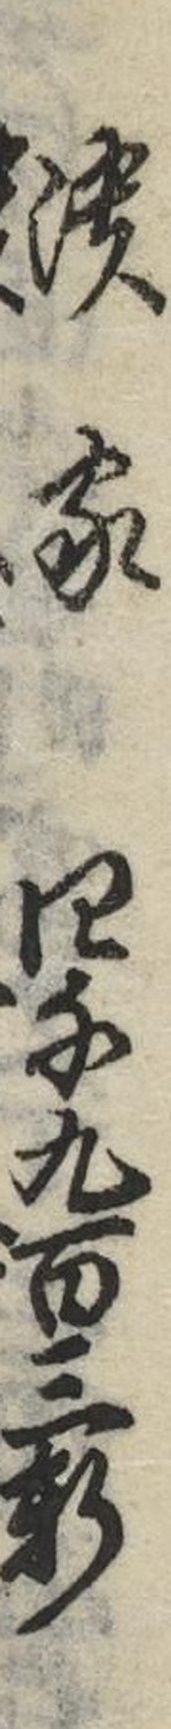潰家四千九百三軒
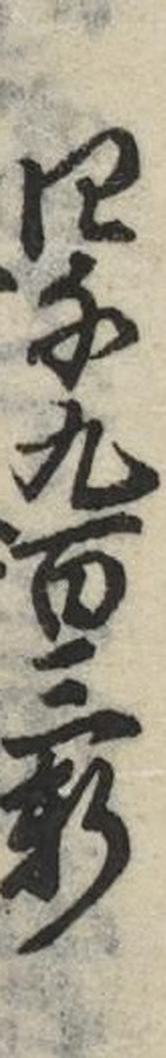潰家四千九百三軒
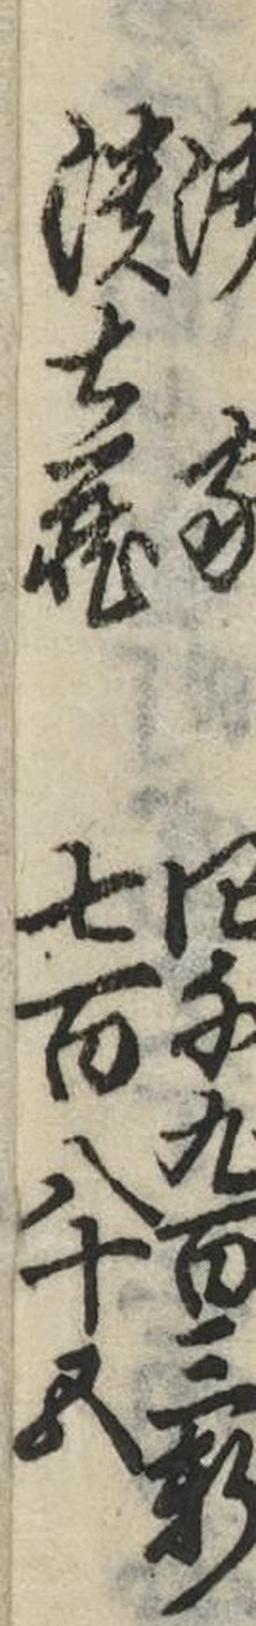潰土蔵七百八十五
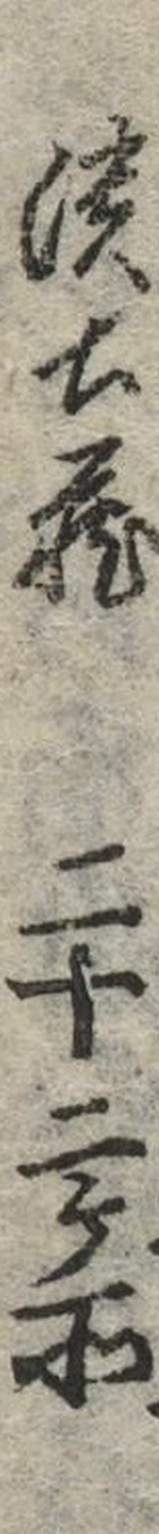潰土蔵二十六ケ所
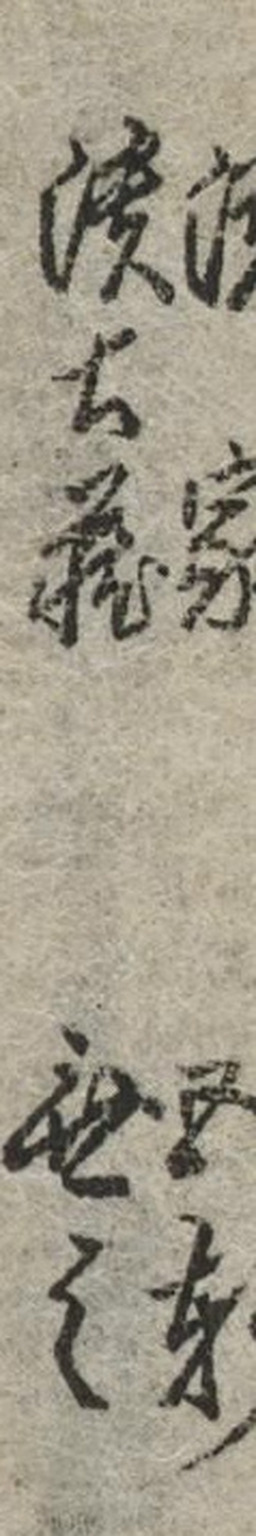潰土蔵無之
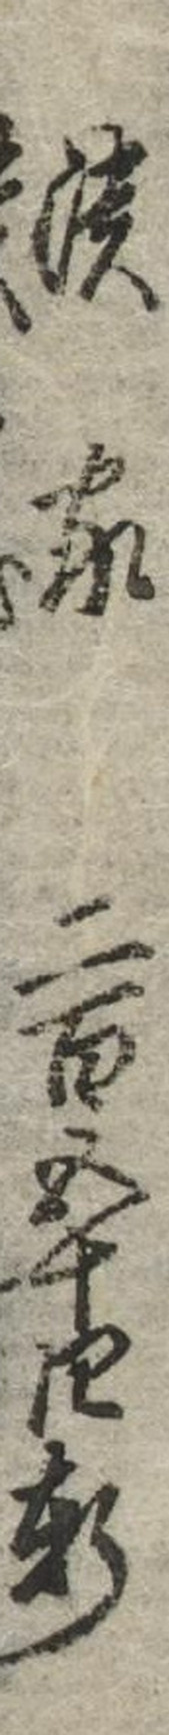潰家百五十四軒
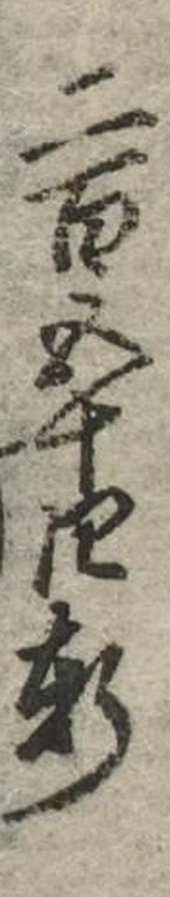潰家百五十四軒
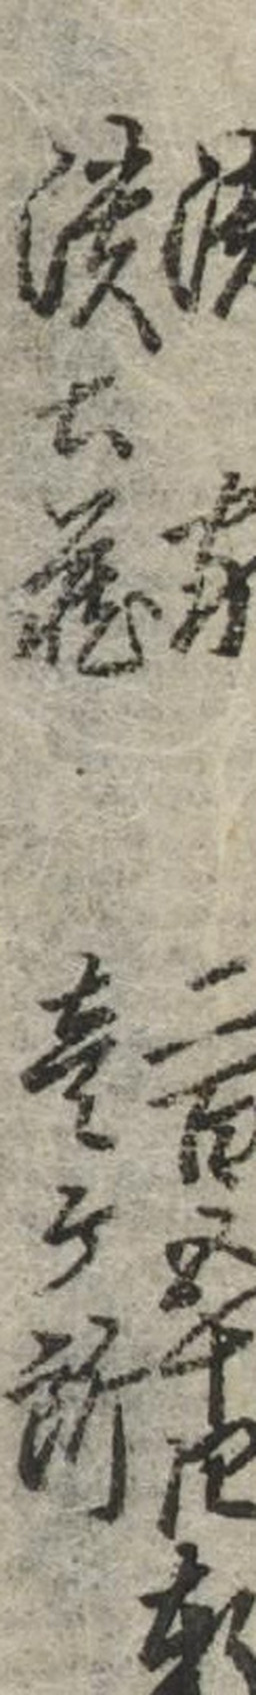潰土蔵五ケ所

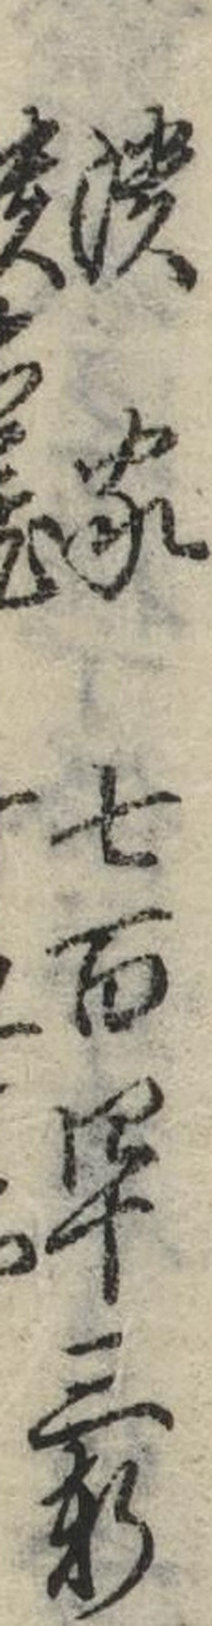潰家二百五十四軒
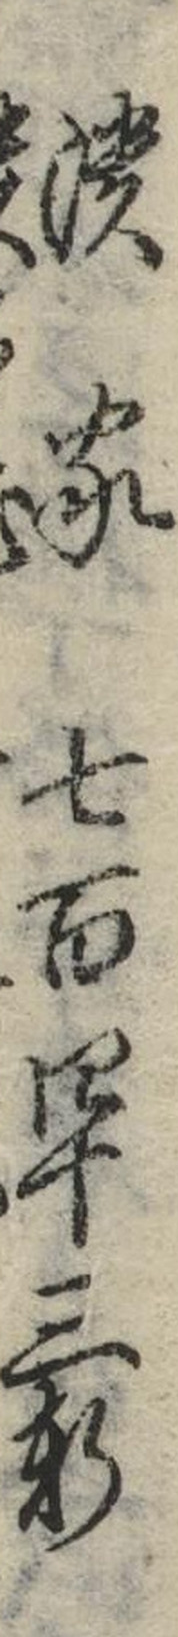潰家二百五十四軒
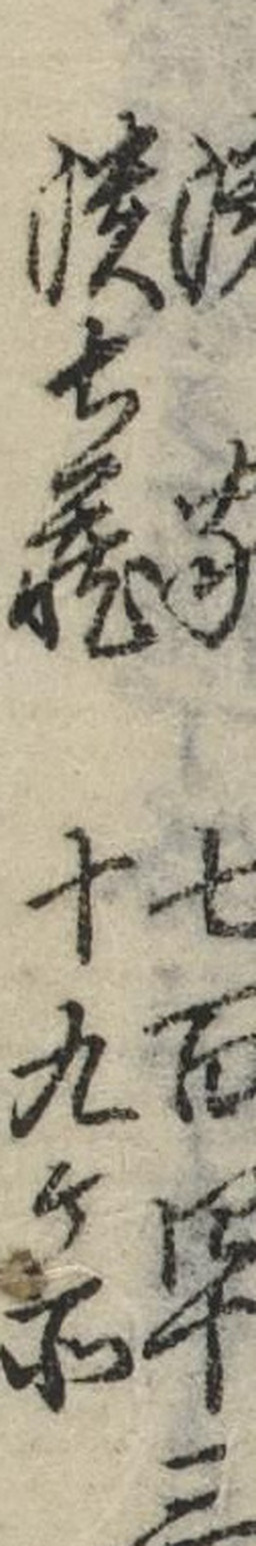潰土蔵二十二ケ所
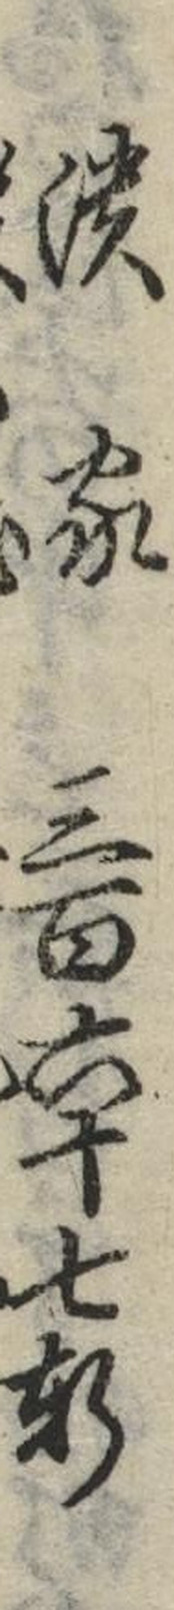潰家二百五十四軒
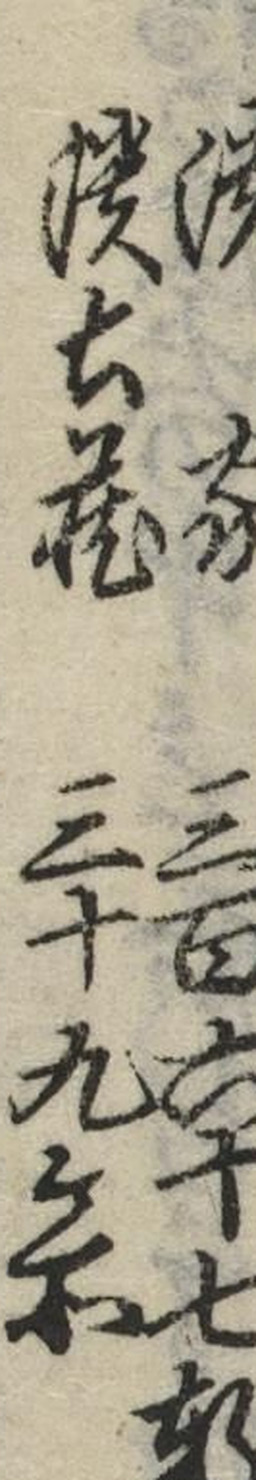潰土蔵二十二ケ所
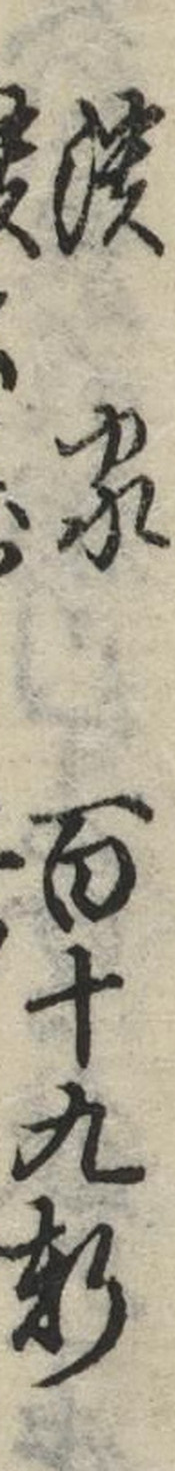潰家十八軒
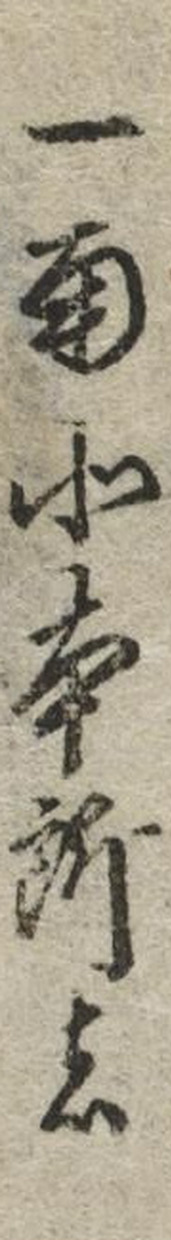一南北本所は
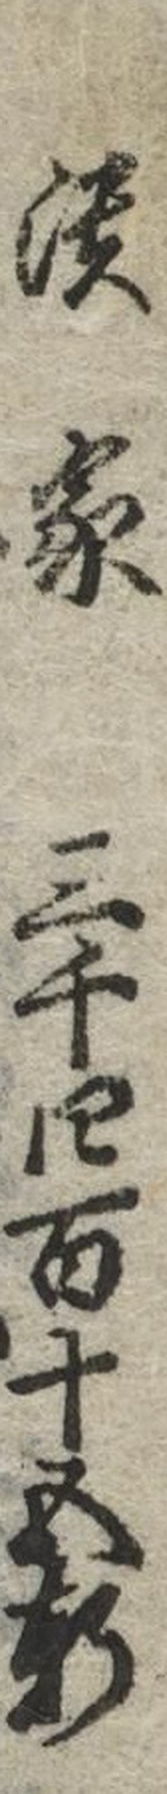潰家三千四百十五軒
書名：江戸御屋鋪方町方共　地震類焼場所巨細書之寫　潰家潰土蔵共取調附街道筋近在迄
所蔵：東京大学地震研究所図書室 Earthquake Research Institute Library, The University of Tokyo, JAPAN
